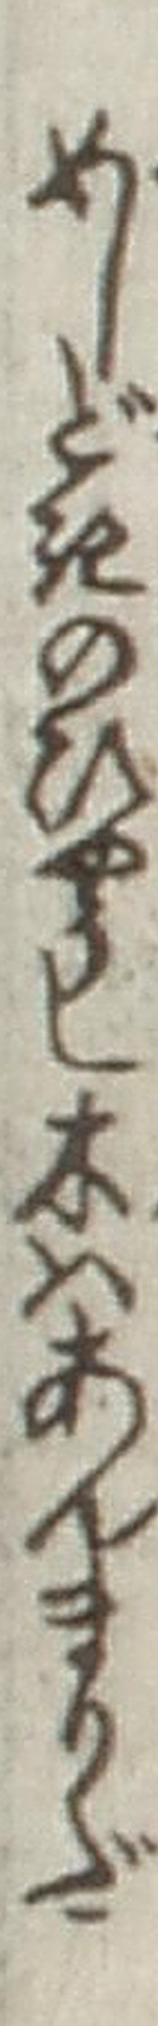めしどきのひやうし木はあんまりだ

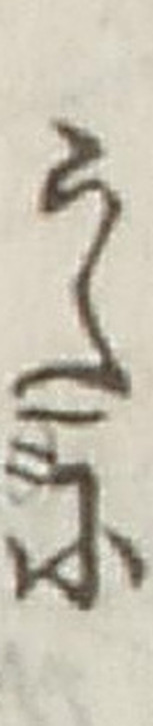うたに
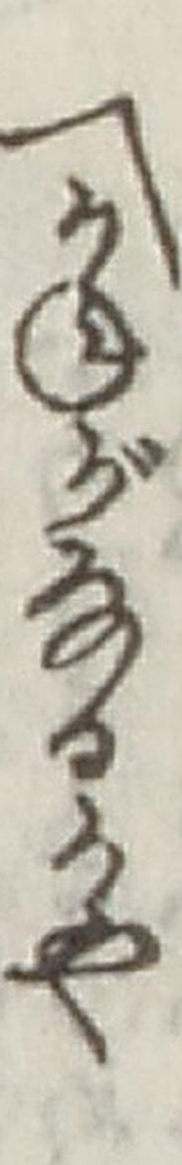〽かねがなるかや
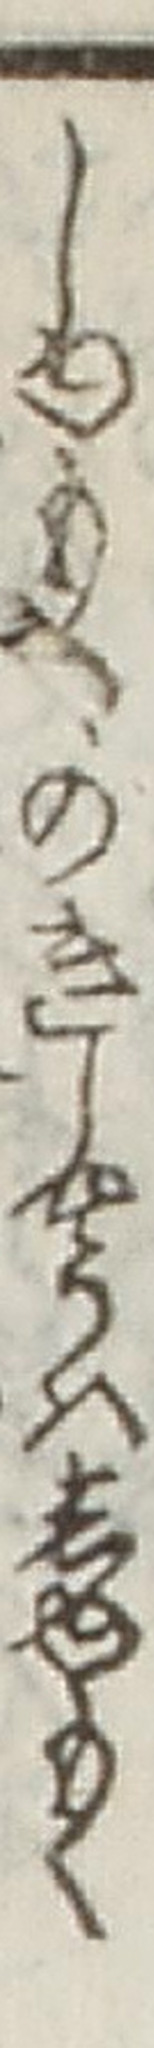しゆもくのきしやうはしゆもく
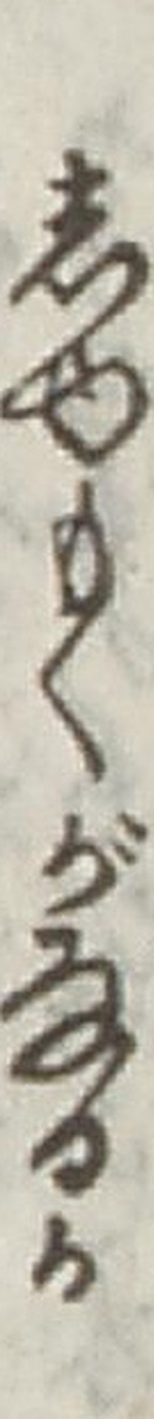しゆもくがなるか
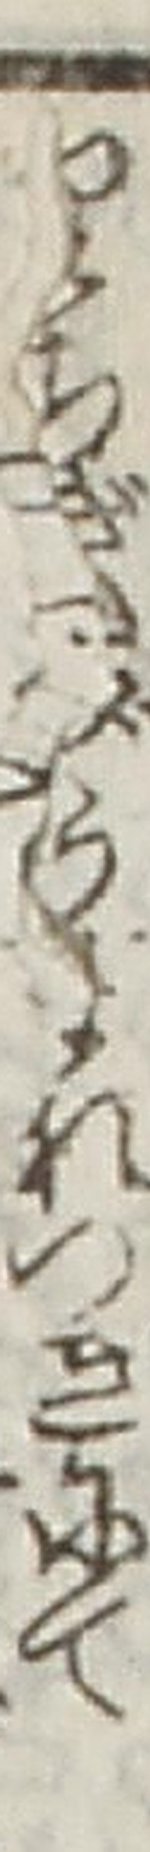りちぎうまれつきにて
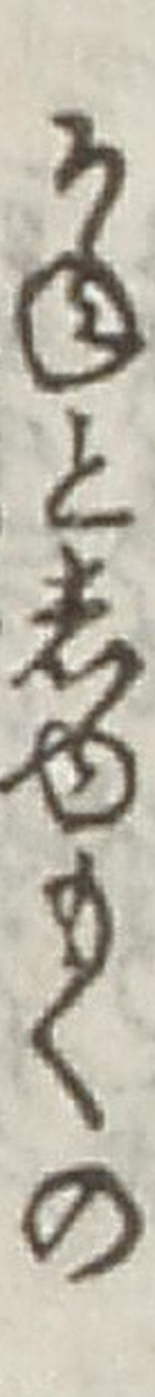かねとしゆもくの
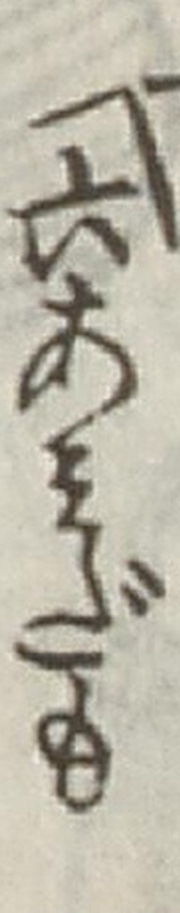〽六あみだも
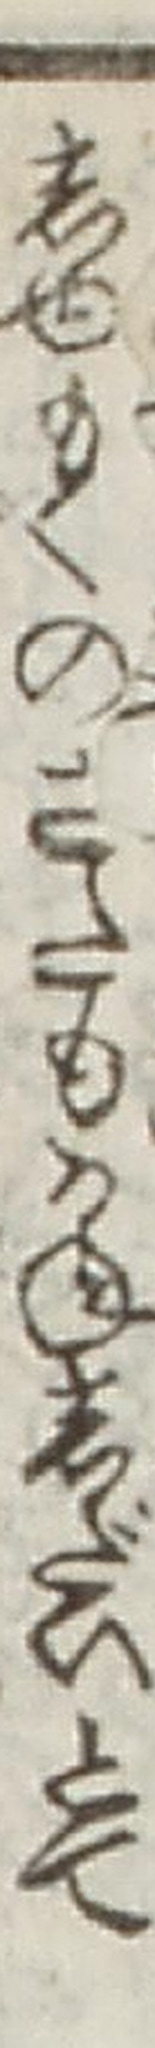しゆもくのさたもかねしだいとて
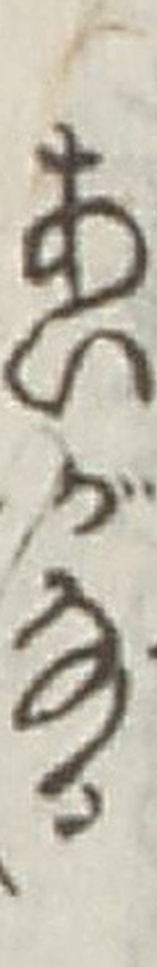あいがなる
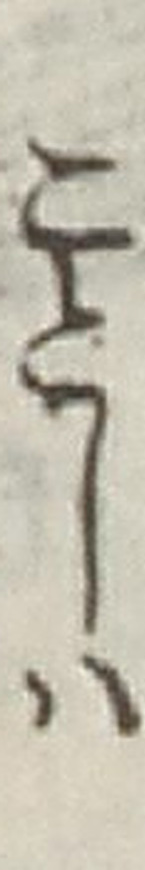ことしは
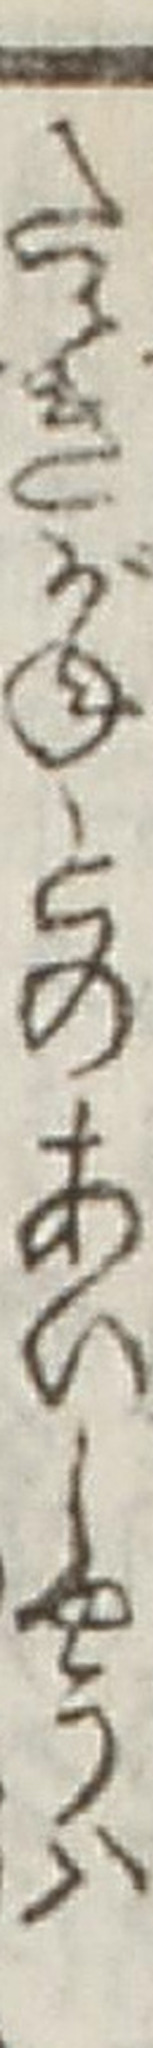たゝきがねとのあいしやうは
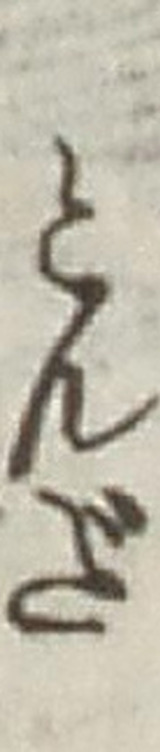とんだ
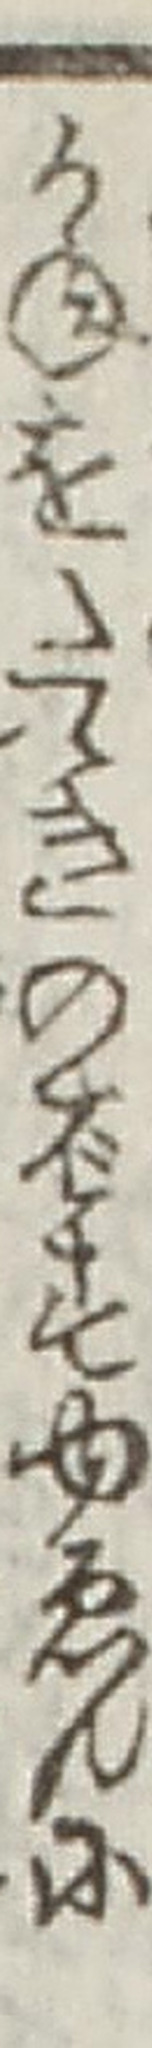かねをたゝきのばすゆゑんに
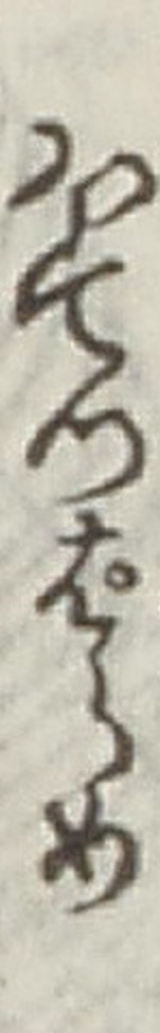ほてつぱらめ
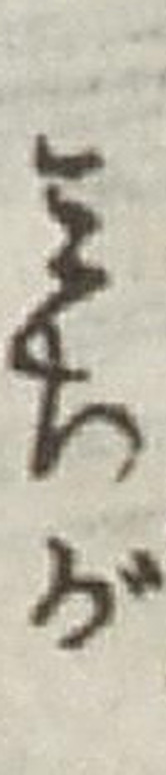みちが
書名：三世相出雲當座帳　上下冊
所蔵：東京大学地震研究所図書室 Earthquake Research Institute Library, The University of Tokyo, JAPAN
